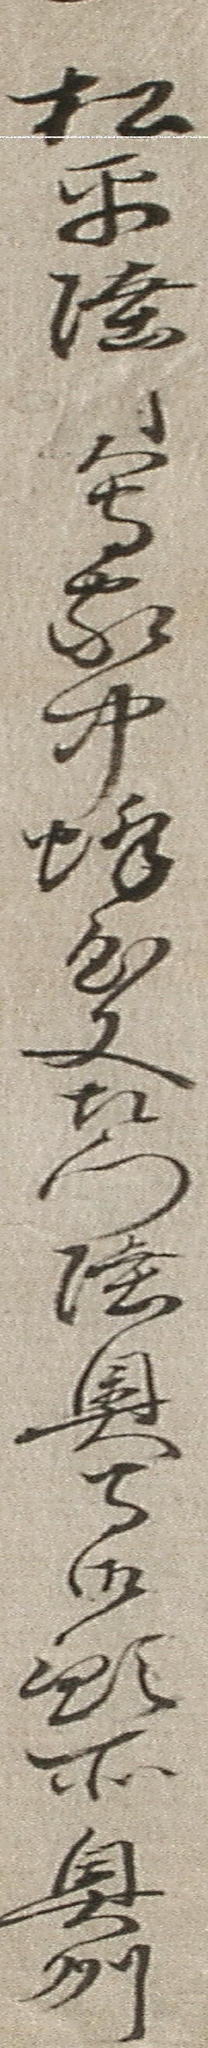一松平陸奥守家中蜂屋又左衛門陸奥守御領所奥州
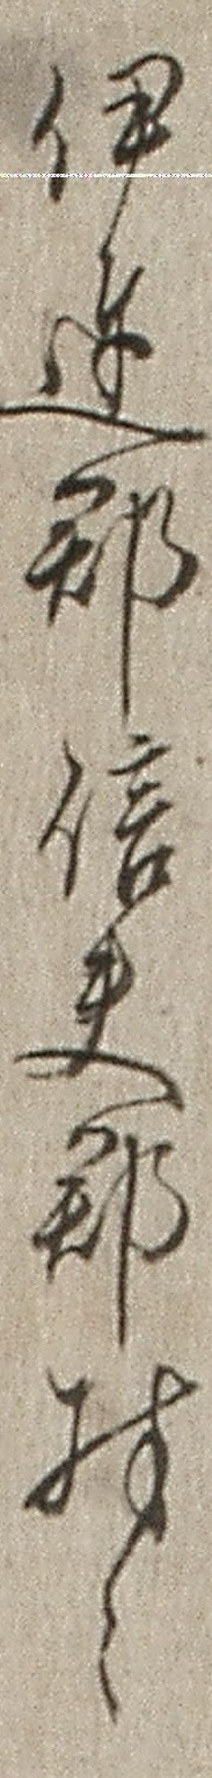伊達郡信夫郡村々
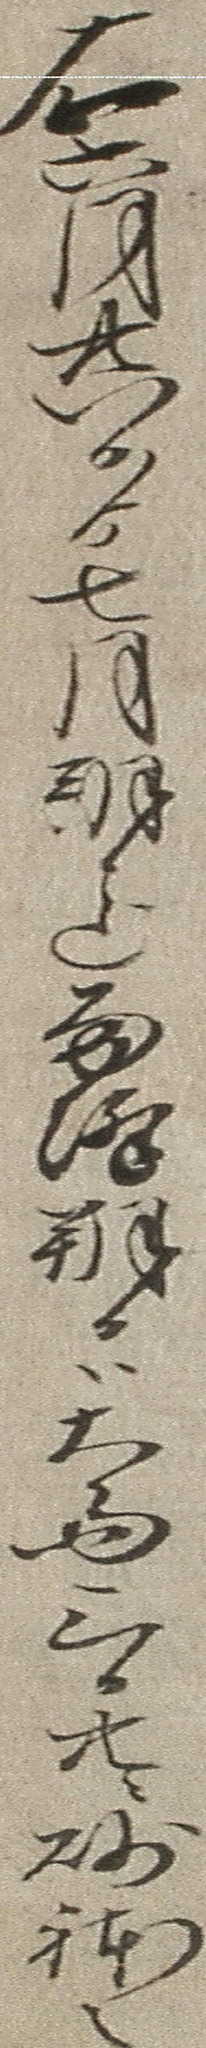右六月廿八日ゟ七月朔日迄雨降朔日は大雨三日共に砂体之
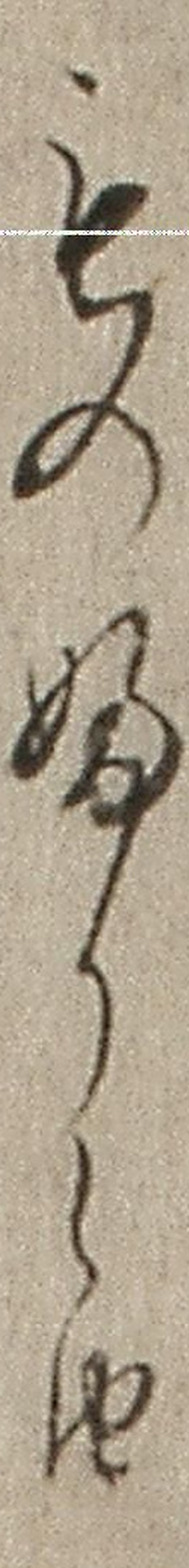ものふり候由
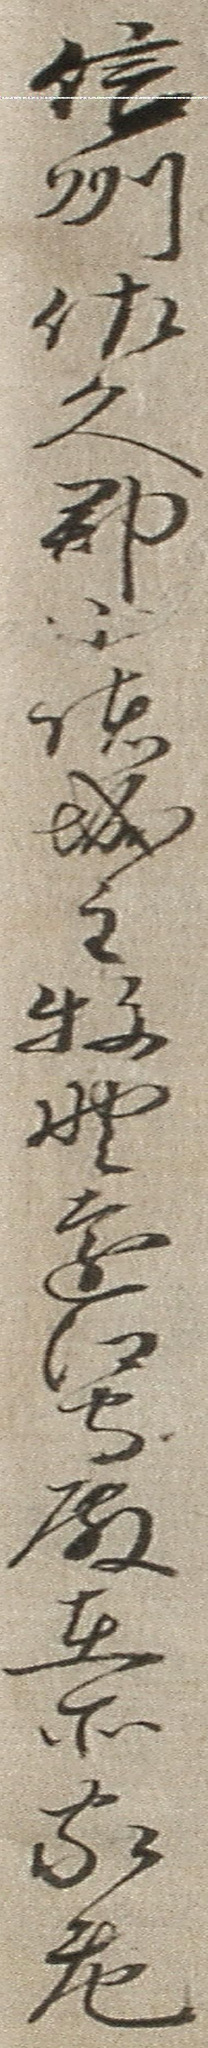信州佐久郡小諸城主牧野遠江守殿在所家老
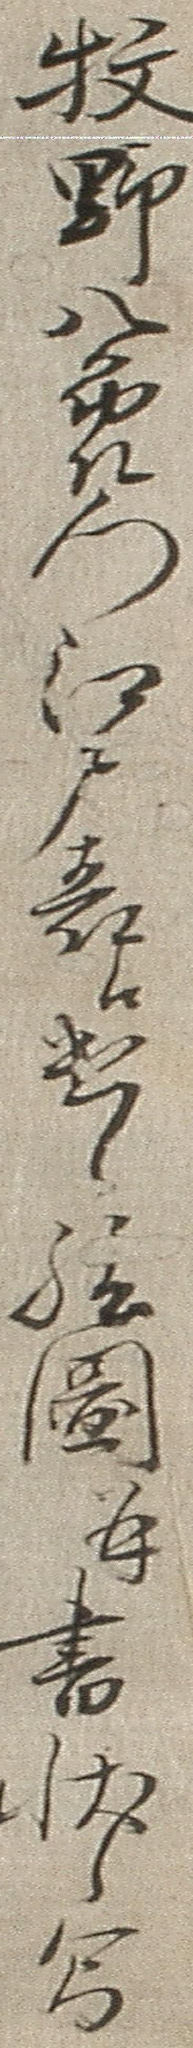牧野八郎左衛門江戸表江遣候絵図并書状之写
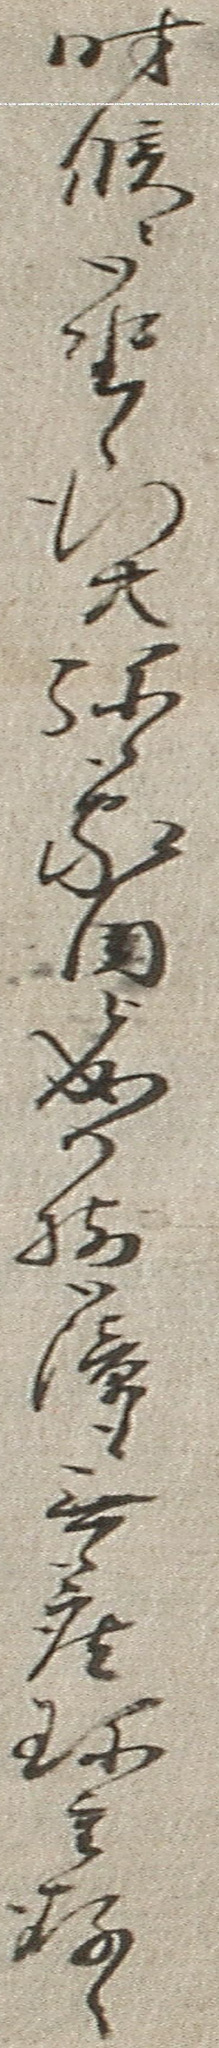時候に御座候得共弥御家内被成御揃御障も無御座珍重存候
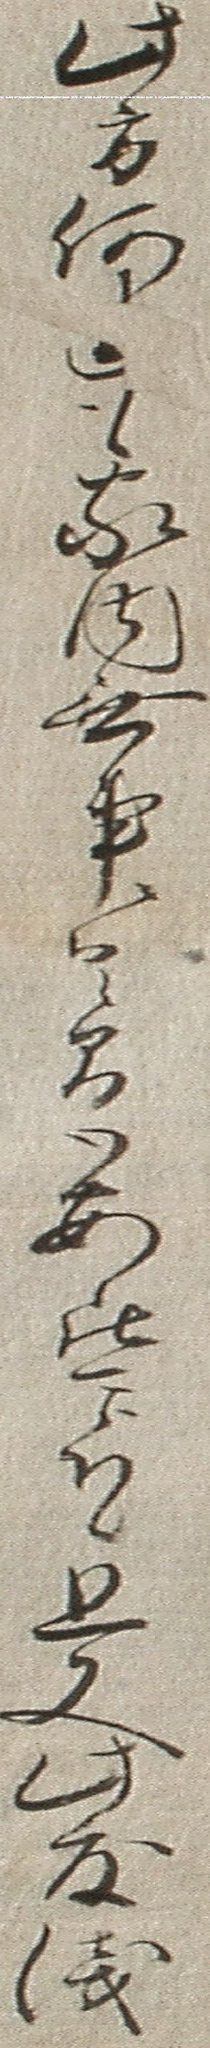此方何連も家内無事に而候間御安仕可被下候且又此度浅
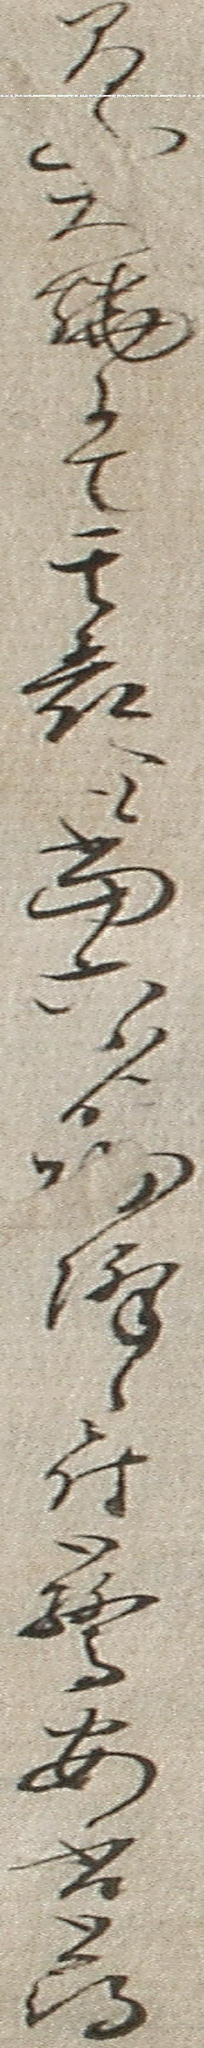間山大焼にて其表へも当六日ゟ砂降候に付御驚安否御得
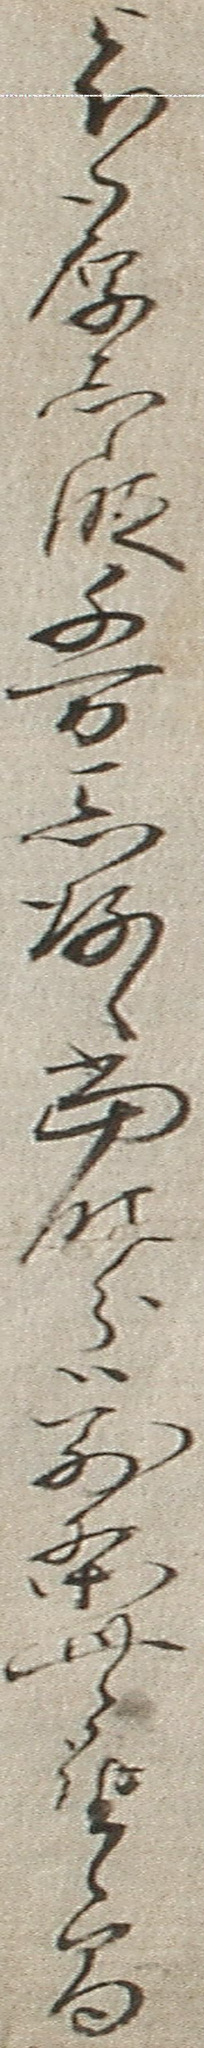被下御厚志之段千万忝存候当領分は別条無御座候間
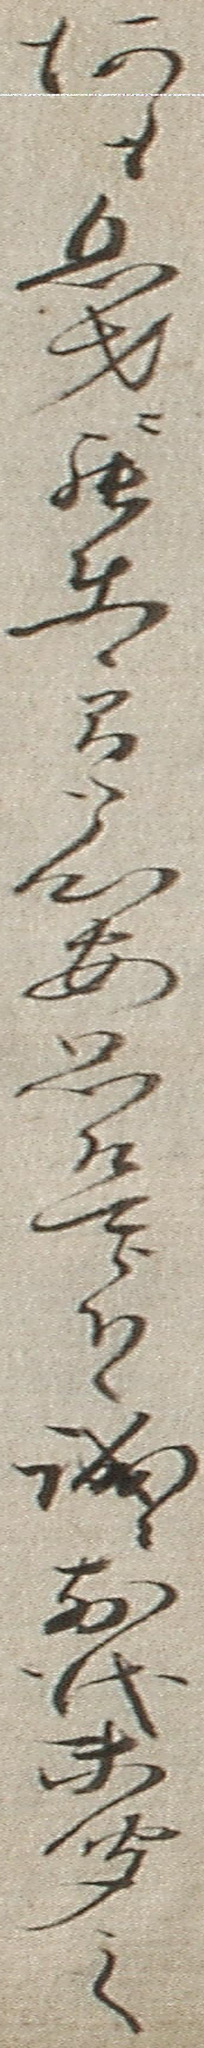何も息才に罷在候間御心安思召可被下候誠に前代未聞之
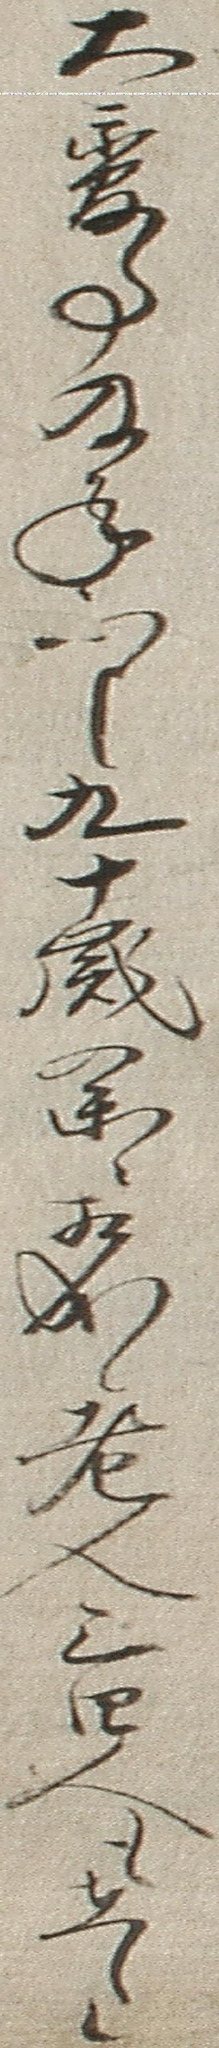大変事及かね不申候九十歳余に相成候老人三四人も在之候

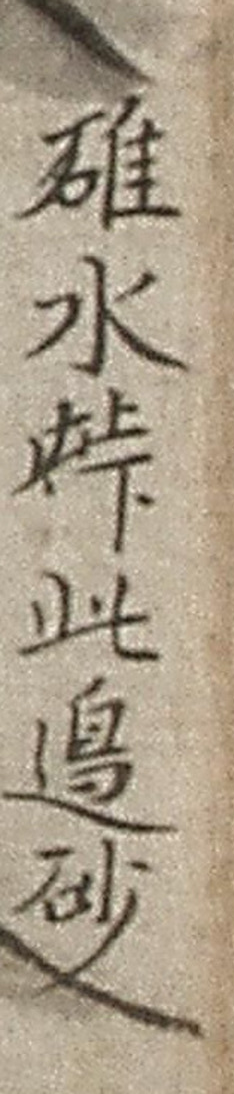碓氷峠此辺砂
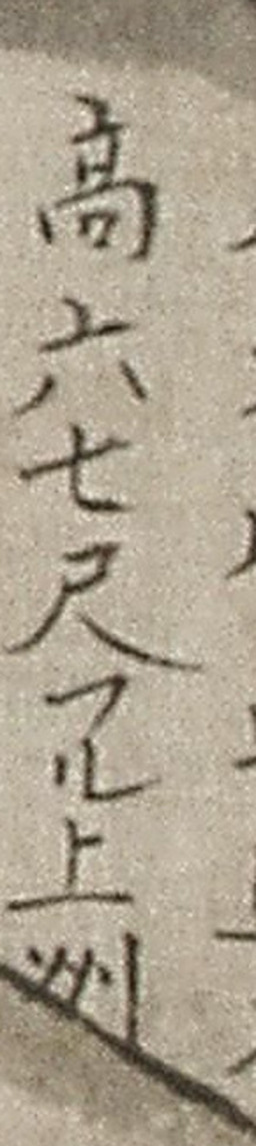高六七尺フル上州
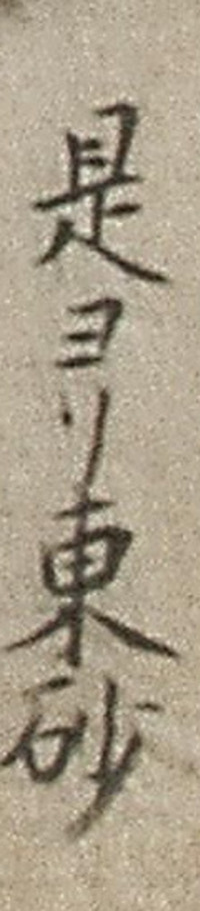是ヨリ東砂
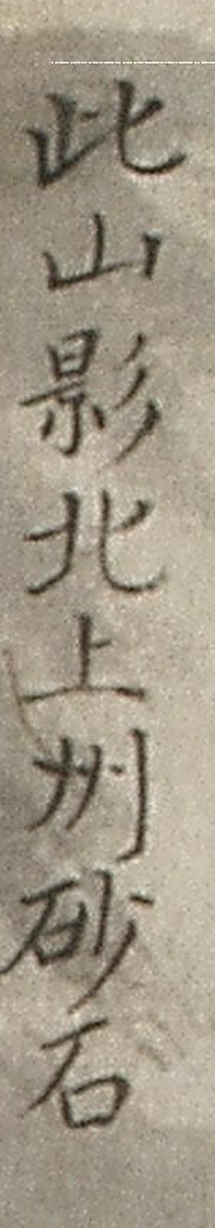此山影北上州砂石
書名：太平秘録抜書　浅間山燒及普賢山崩
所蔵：東京大学地震研究所図書室 Earthquake Research Institute Library, The University of Tokyo, JAPAN
